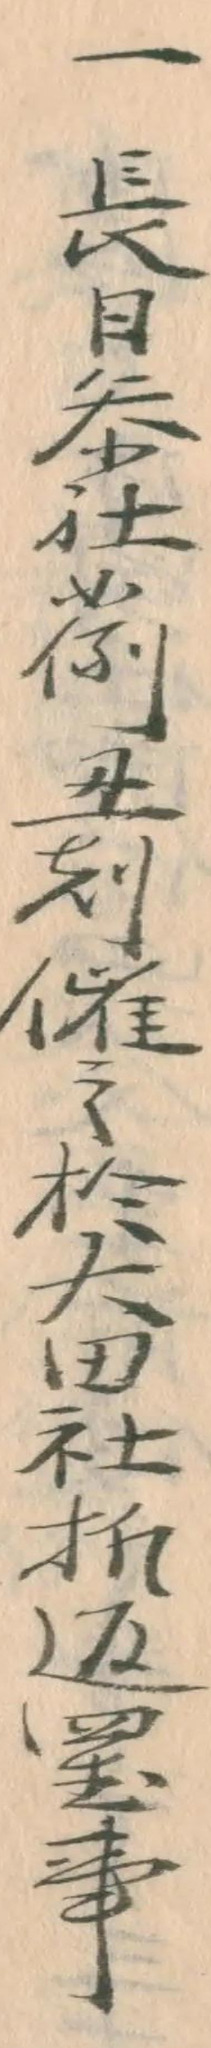一長日参社如例丑刻催也於大田社折返置事
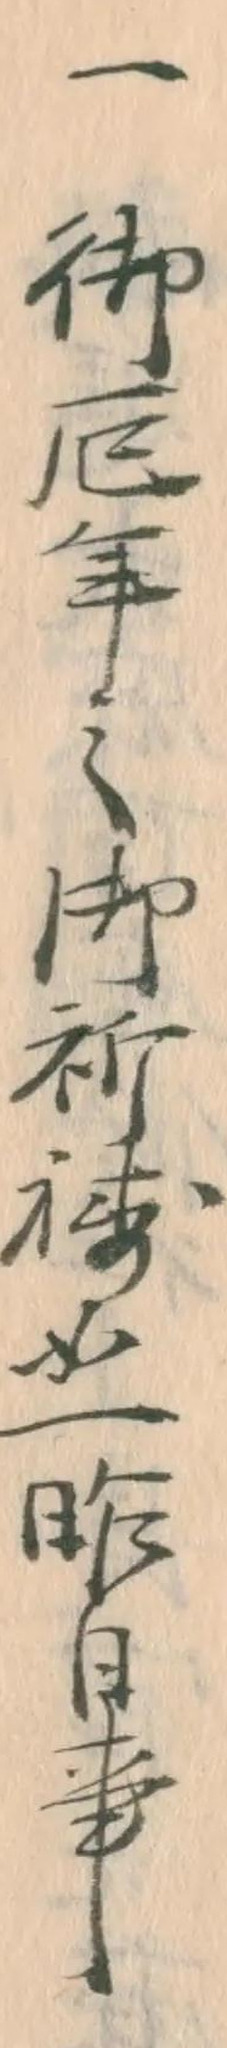一御厄年之御祈祷如一昨日事
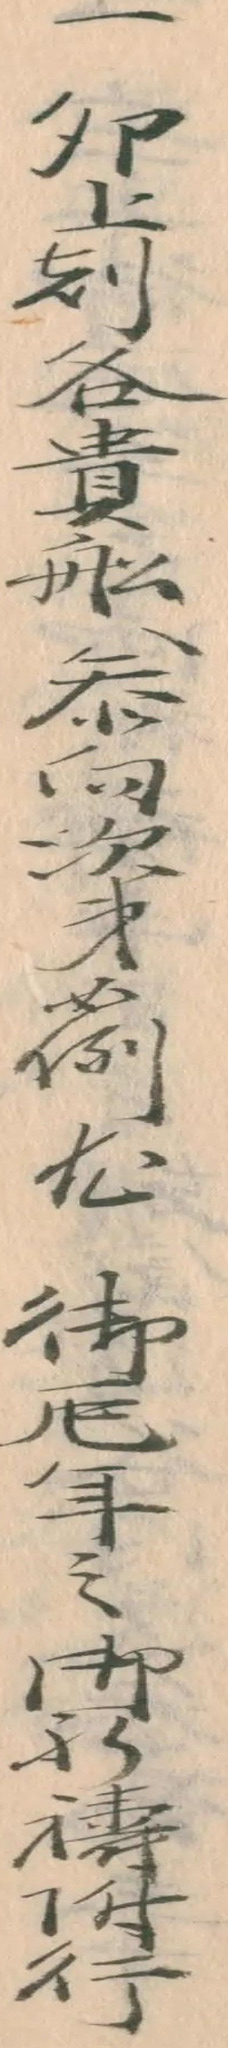一卯上刻各貴舩ヘ参向次第如例尤御厄年之御祈祷附行
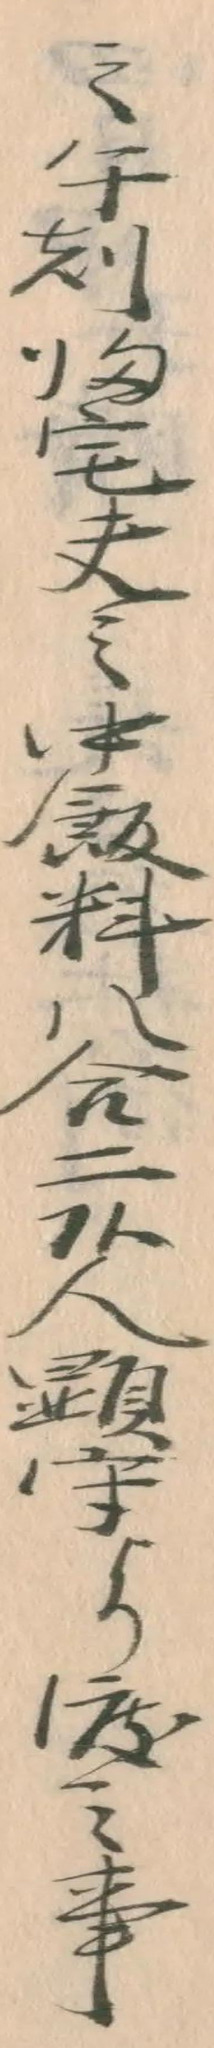之午刻帰宅夫之中飯料八合二頭人顕守より渡之事
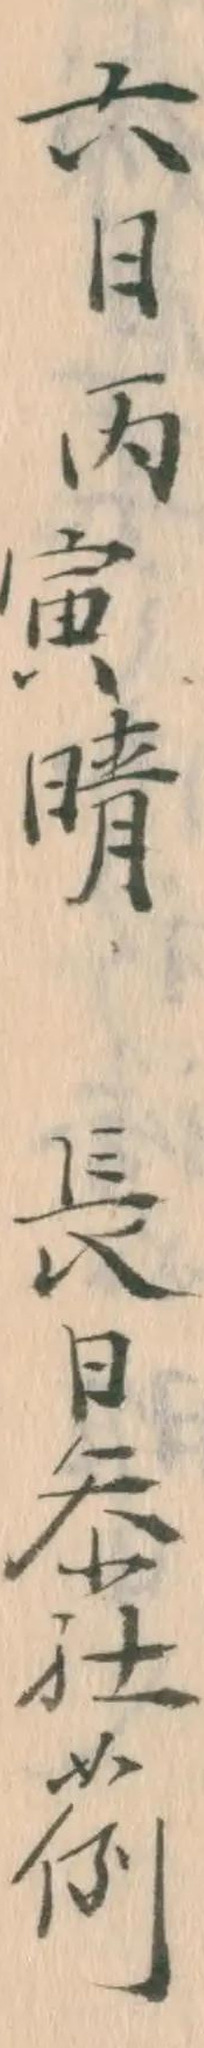六日丙寅晴長日参社如例
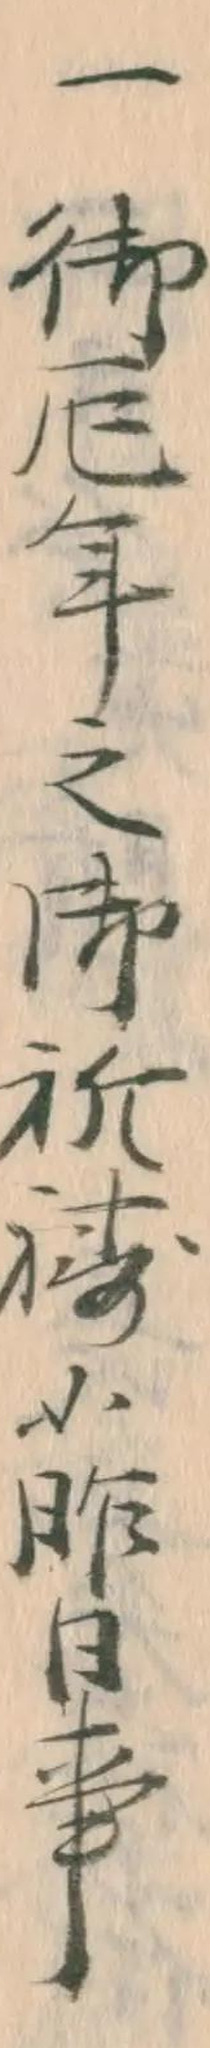一御厄年之御祈祷如昨日事
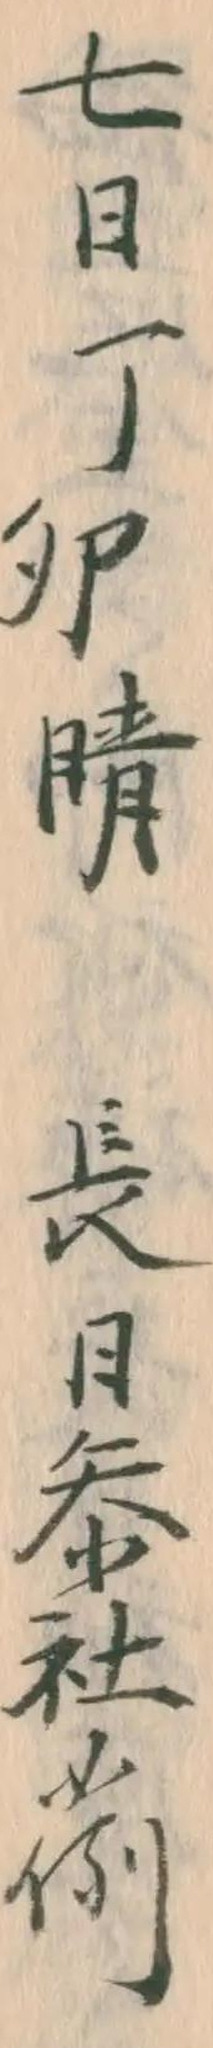七日丁卯晴長日参社如例
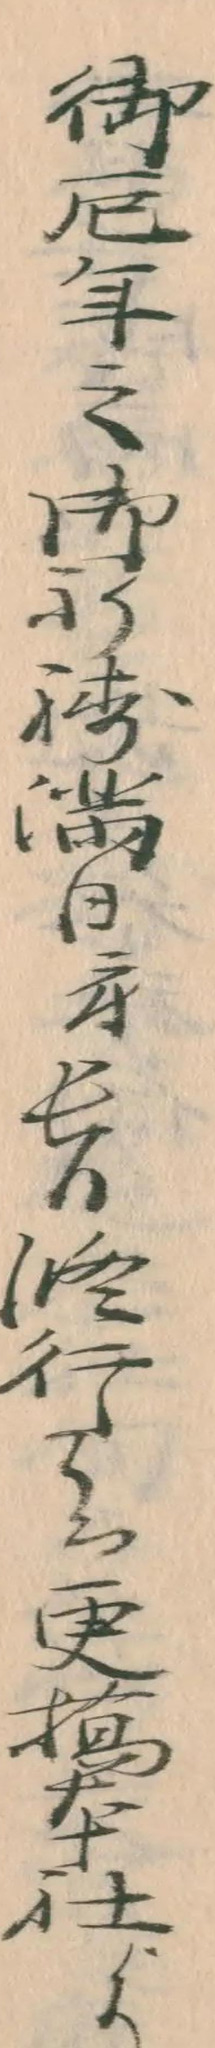一御厄年之御祈祷満日ニ付長日修行了而更橋本社より
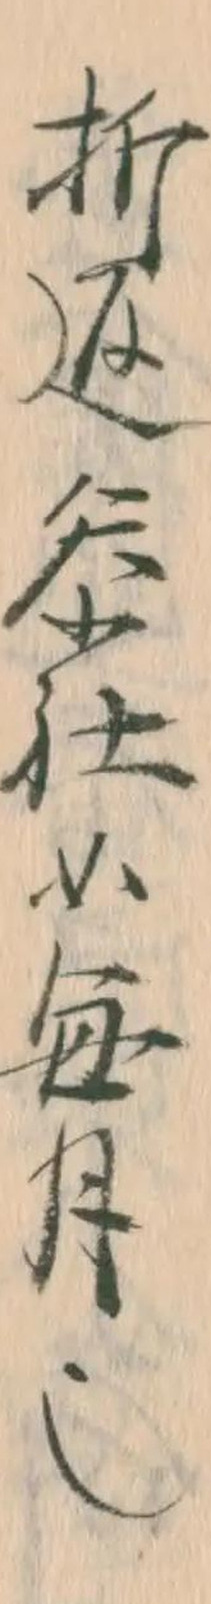折返参社如毎月也
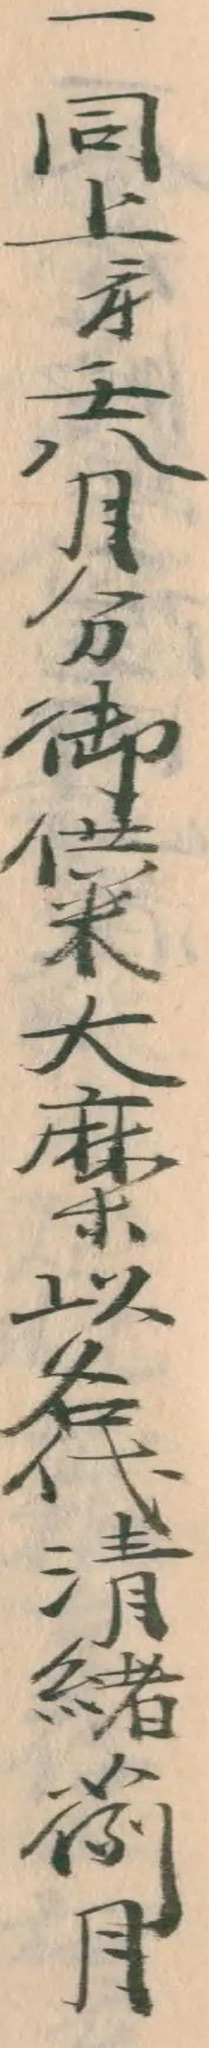一同上ニ付壬八月分御供米大麻等以名代清緒如例月
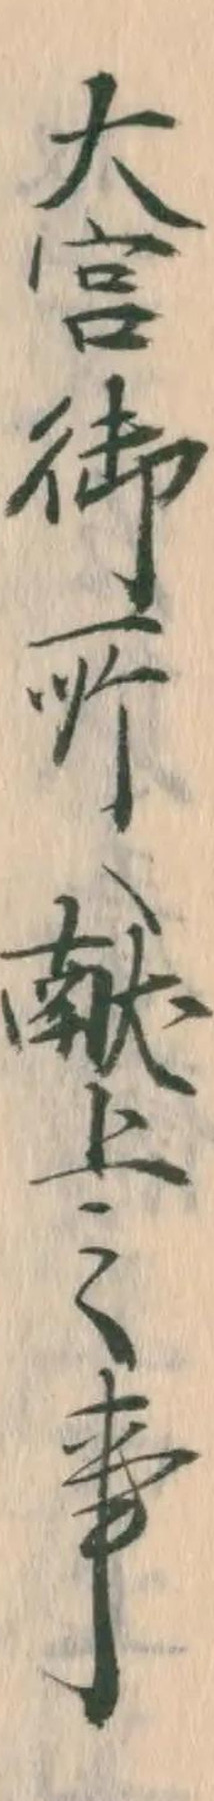大宮御所へ献上之事
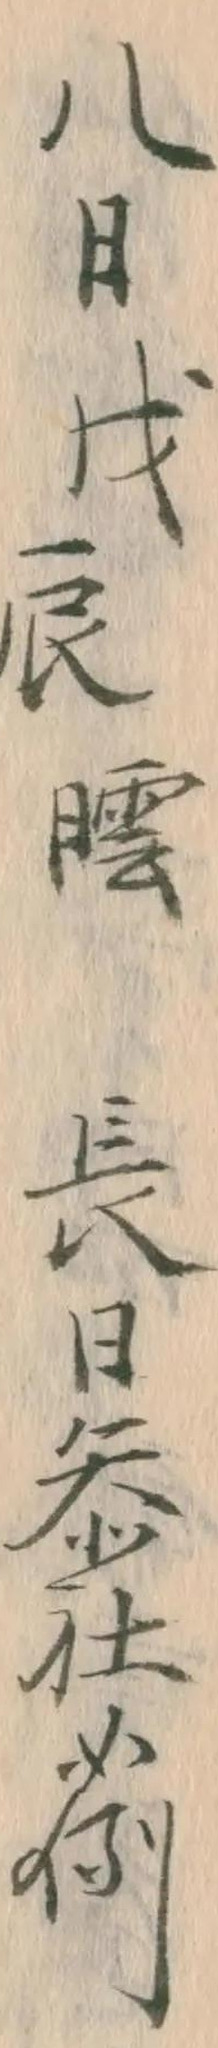八日戊巳曇長日参社如例
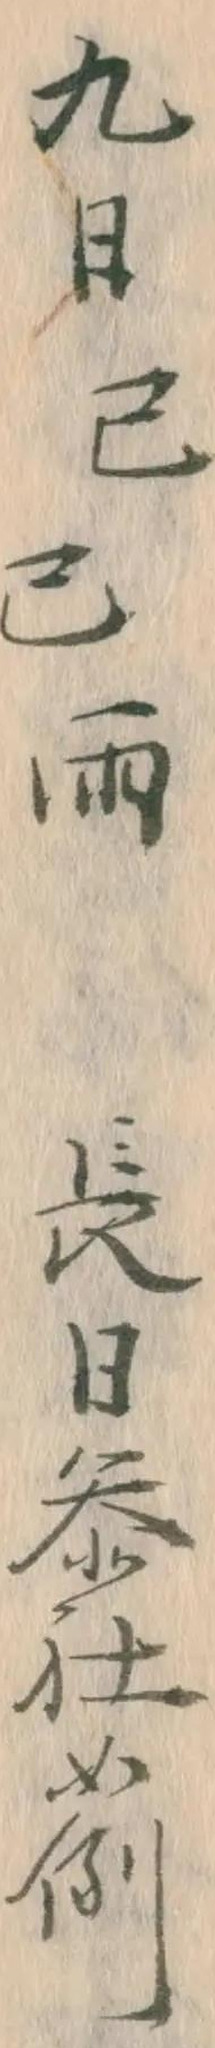九日己巳雨長日参社如例
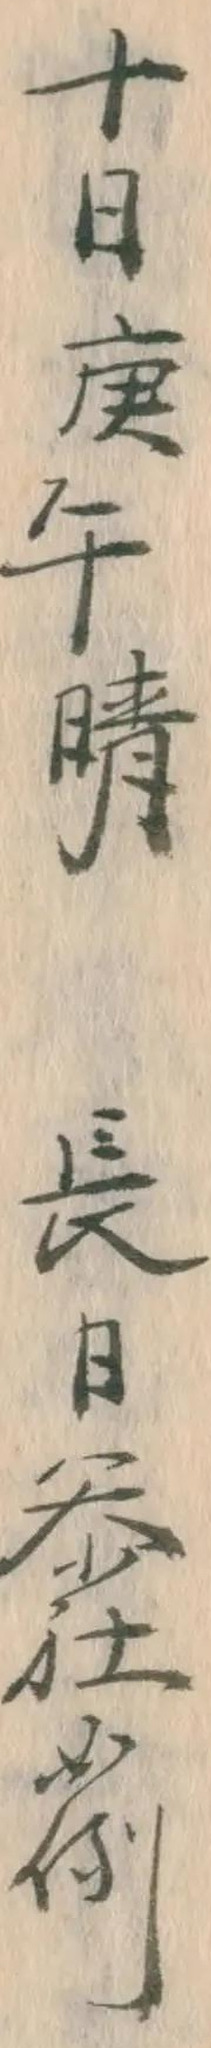十日庚午晴長日参社如例
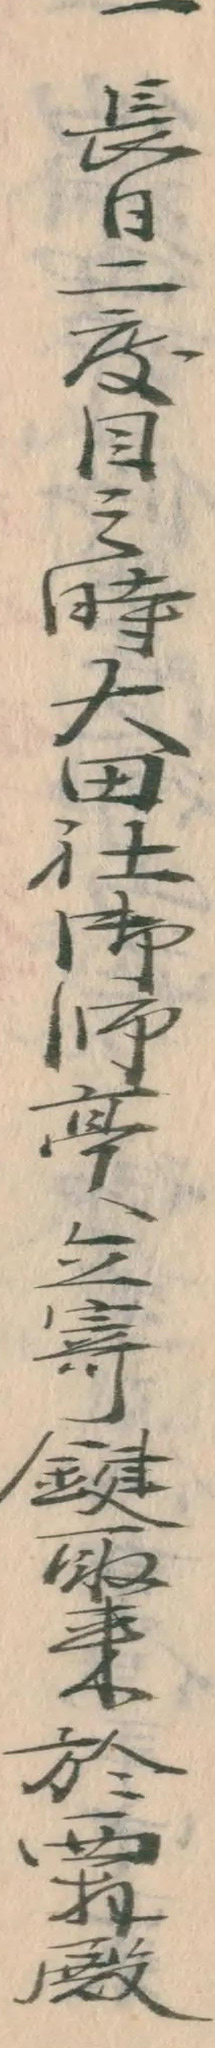一長日二度目之時大田社御師亭へ立寄鍵取来於西拝殿
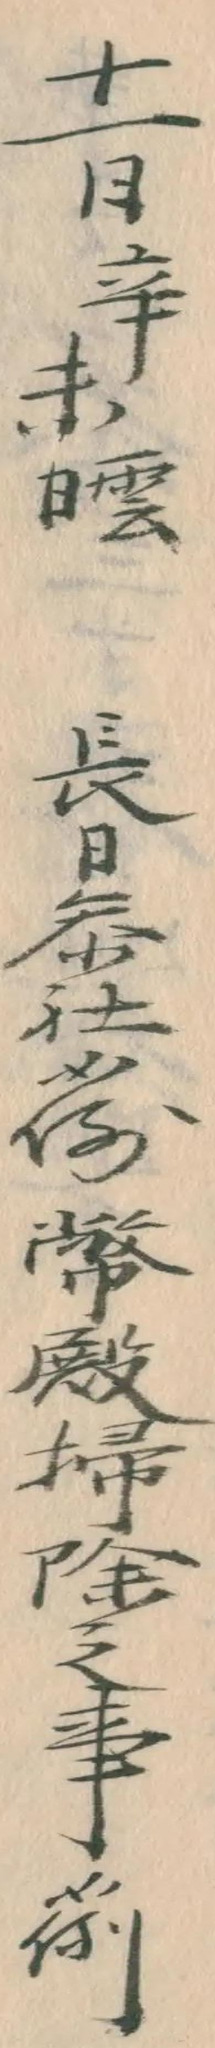十一日辛未曇長日参社如例幣殿帰除之事如例
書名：賀茂社記録. 第73冊
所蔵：国立国会図書館 National Diet Library, JAPAN
